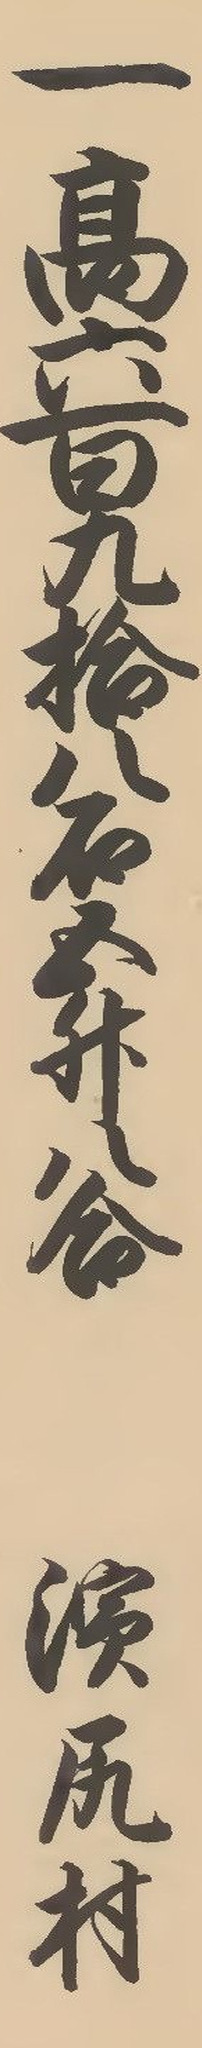一髙六百九拾八石五升八合濱尻村
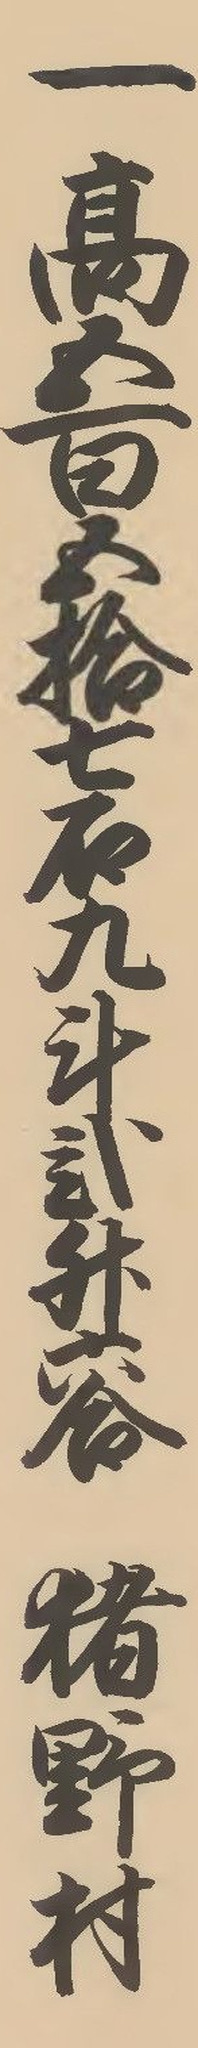一髙五百五拾七石九斗弐升六合猪野村
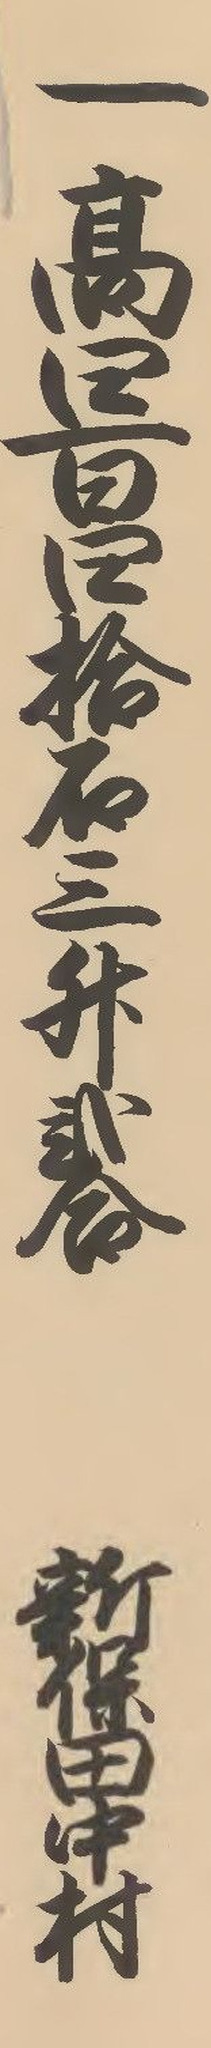一髙四百四拾石三升弐合新保田中村
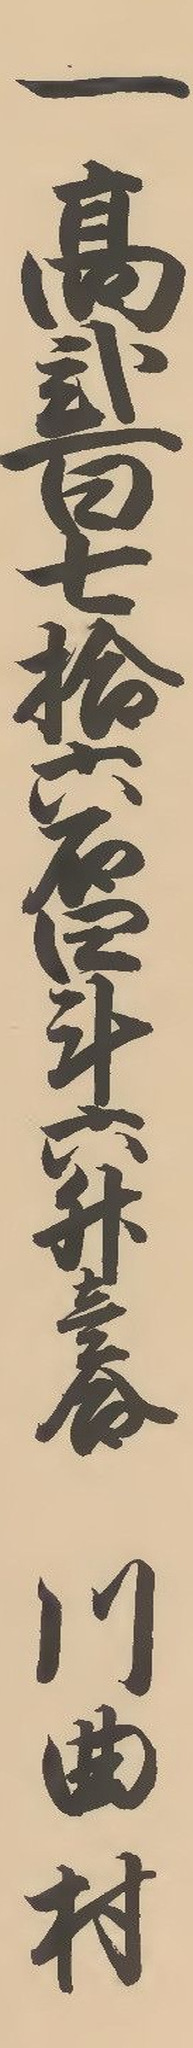一髙弐百七拾六石四斗六升壱合川曲村
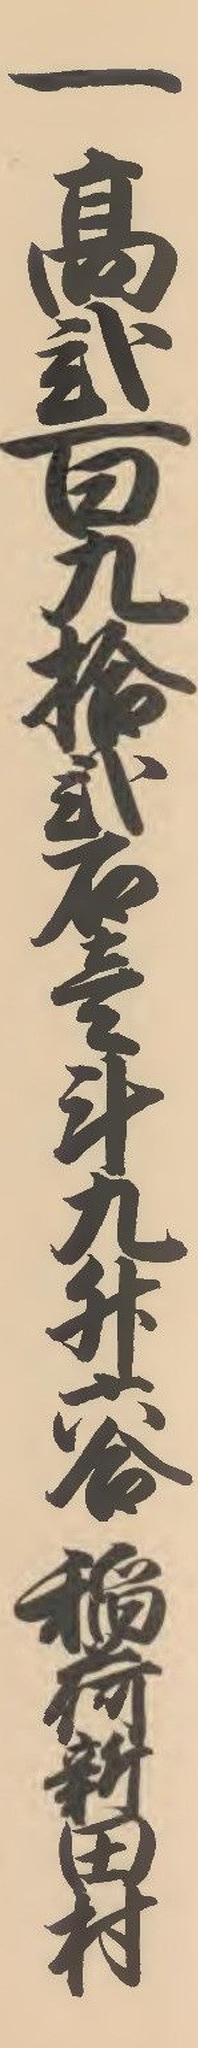一髙弐百九拾弐石壱斗九升六合稲荷新田村
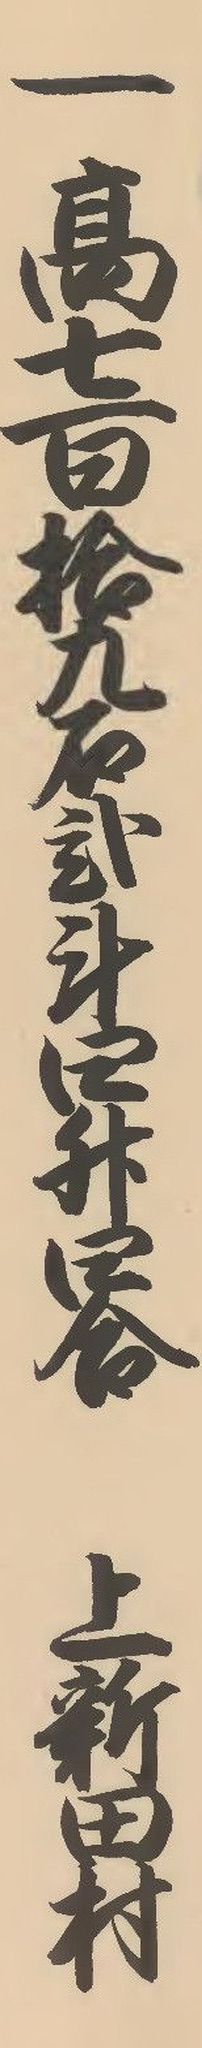一髙七百拾九石弐斗四升四合上新田村
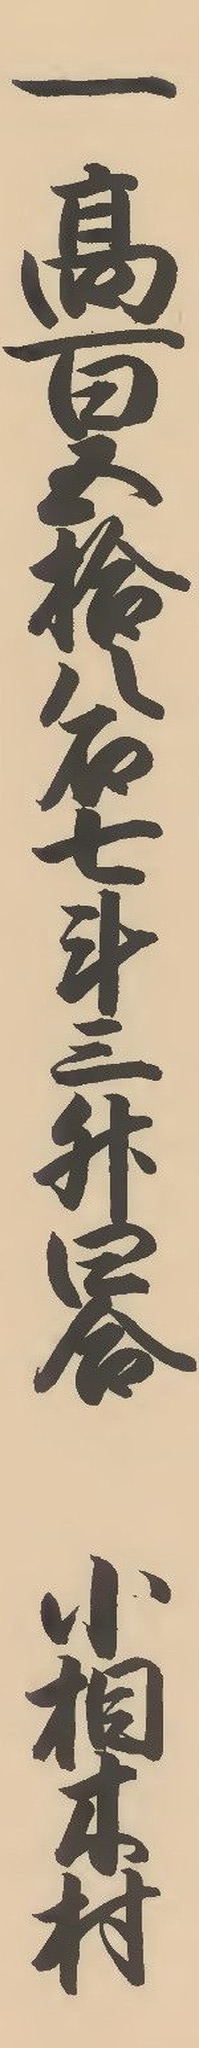一髙百五拾八石七斗三升四合小相木村
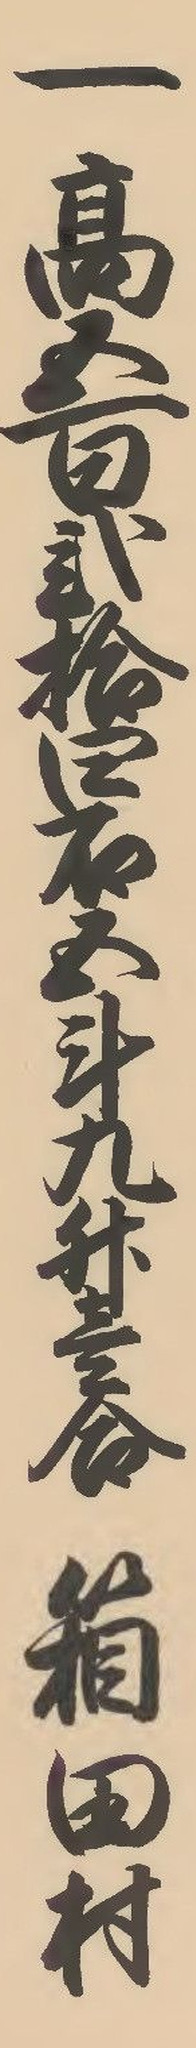一髙五百弐拾四石五斗九升壱合箱田村

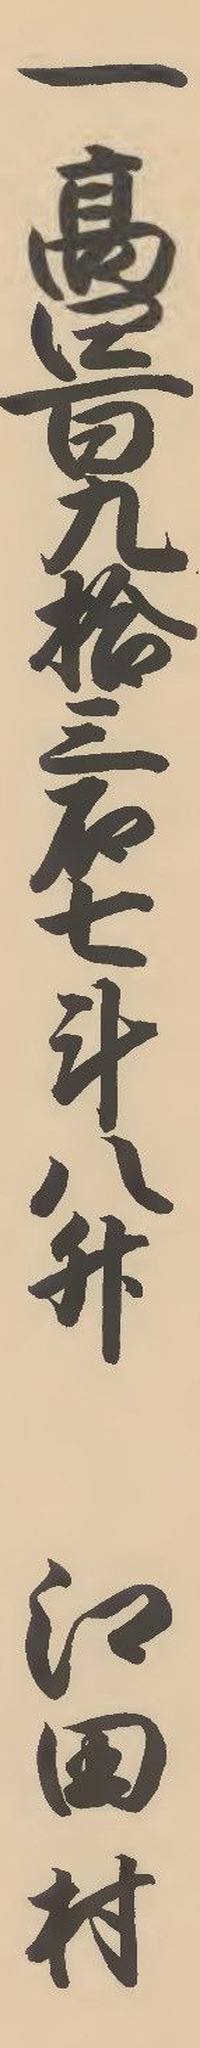一髙四百九拾三石七斗八升江田村
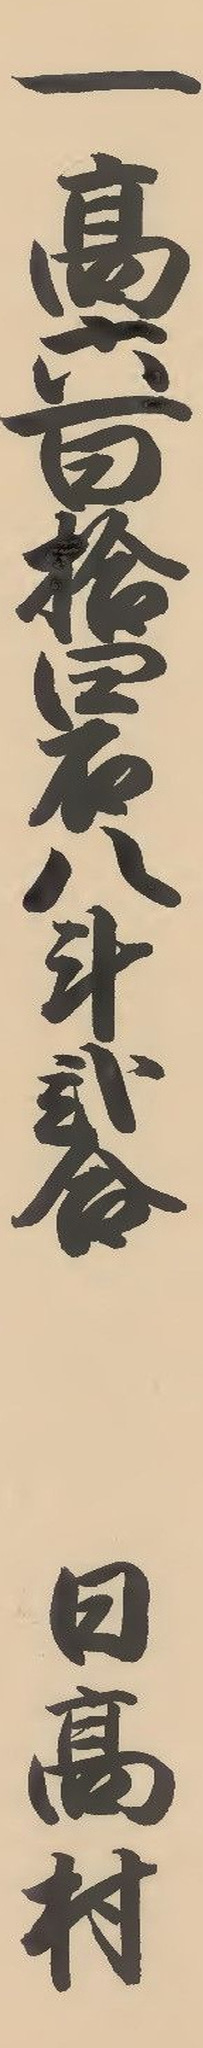一髙六百拾四石八斗弐合日髙村
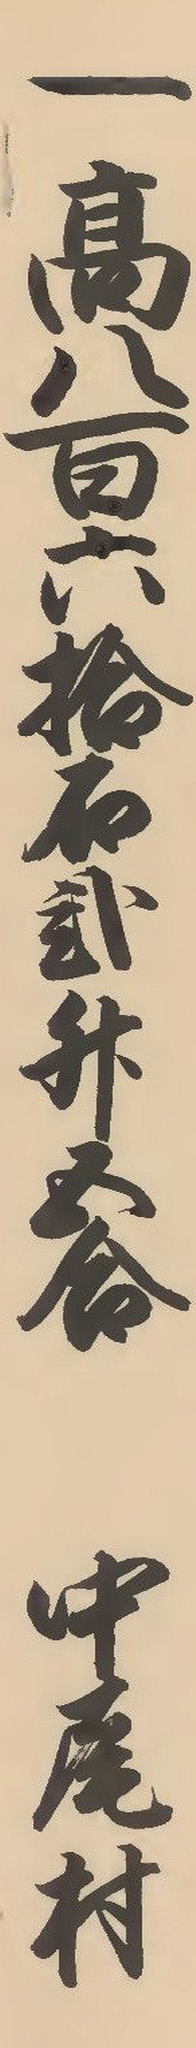一髙八百六拾石弐升五合中尾村
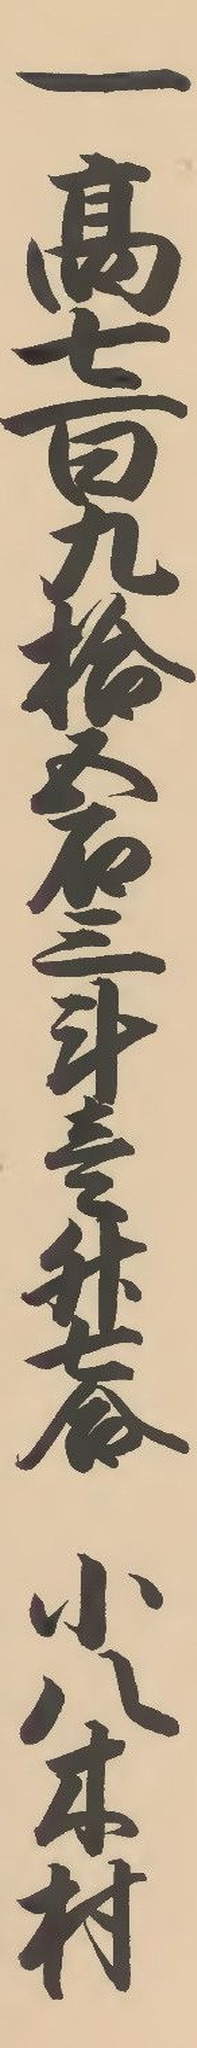一髙七百九拾五石三斗壱升七合小八木村
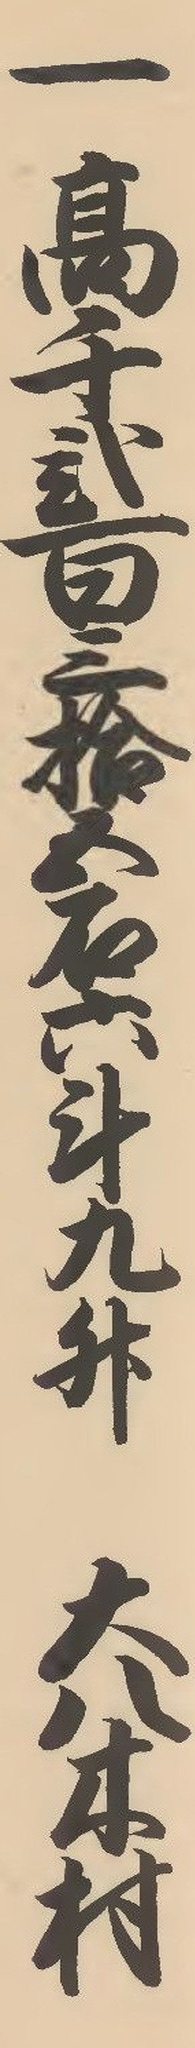一髙千弐百三拾五石六斗九升大八木村
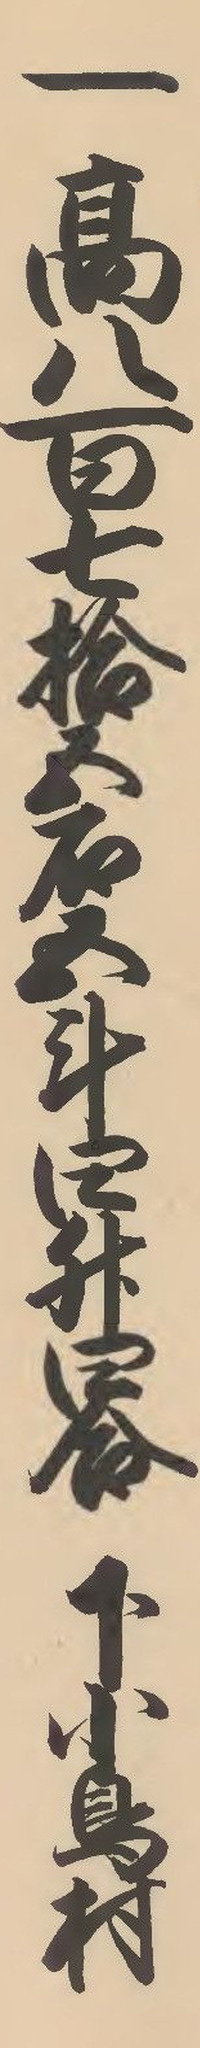一髙八百七拾五石五斗四升四合下小鳥村
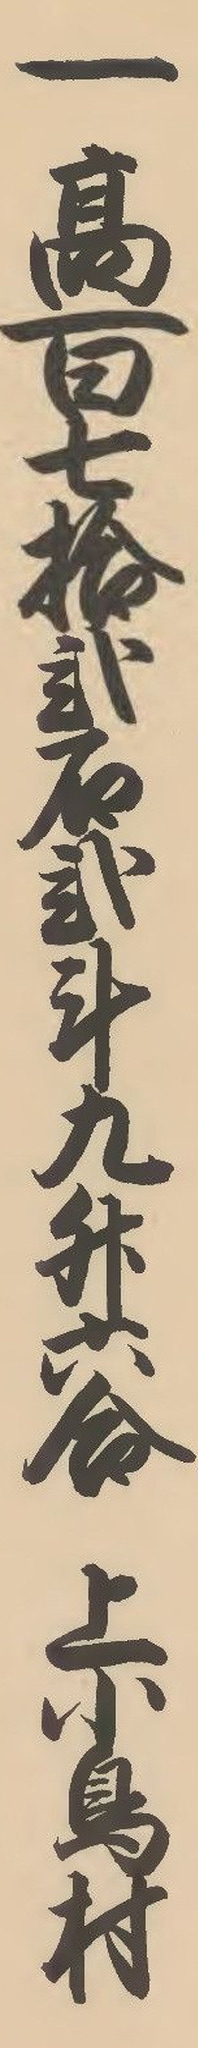一髙百七拾弐石弐斗九升六合上小鳥村
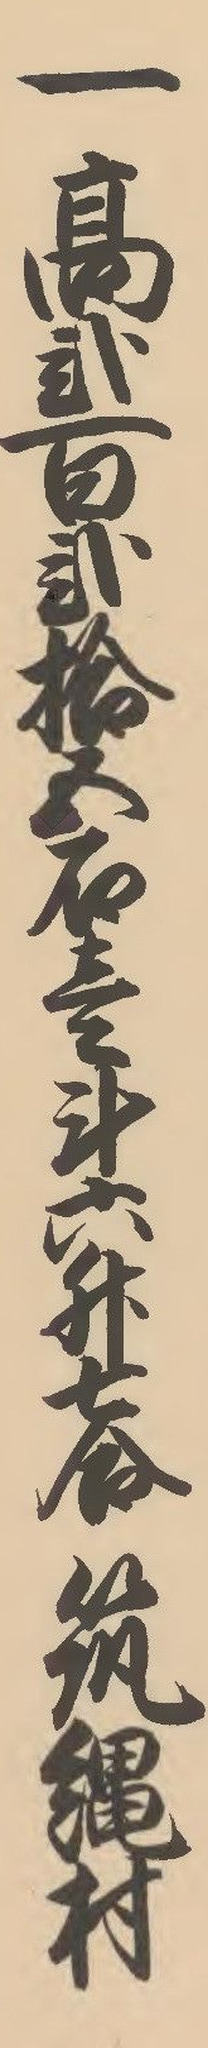一髙弐百弐拾五石壱斗六升七合筑縄村
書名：上野国郷帳
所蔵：国立公文書館 National Archives of Japan
